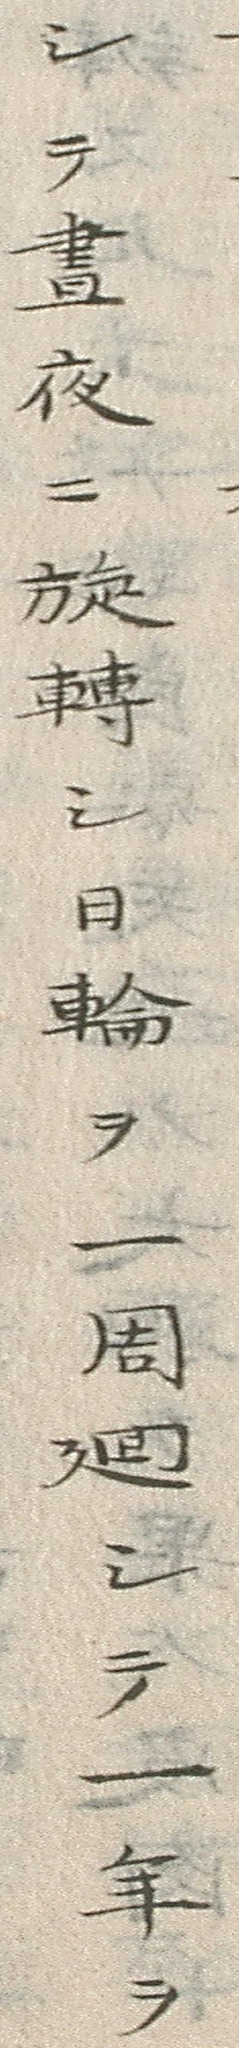シテ昼夜ニ旋転シ日輪ヲ一周廻シテ一年ヲ
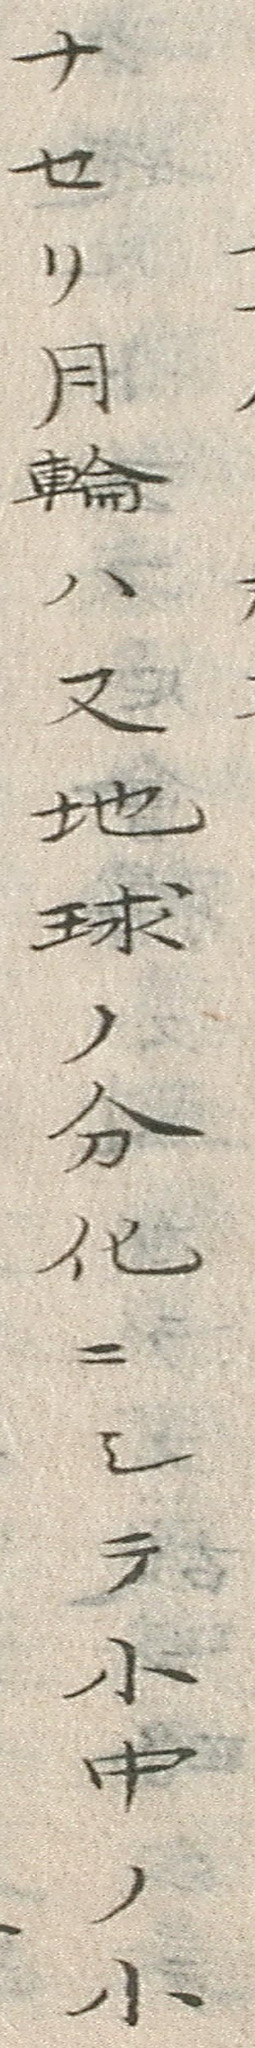ナセリ月輪ハ又地球ノ分化ニシテ小中ノ小
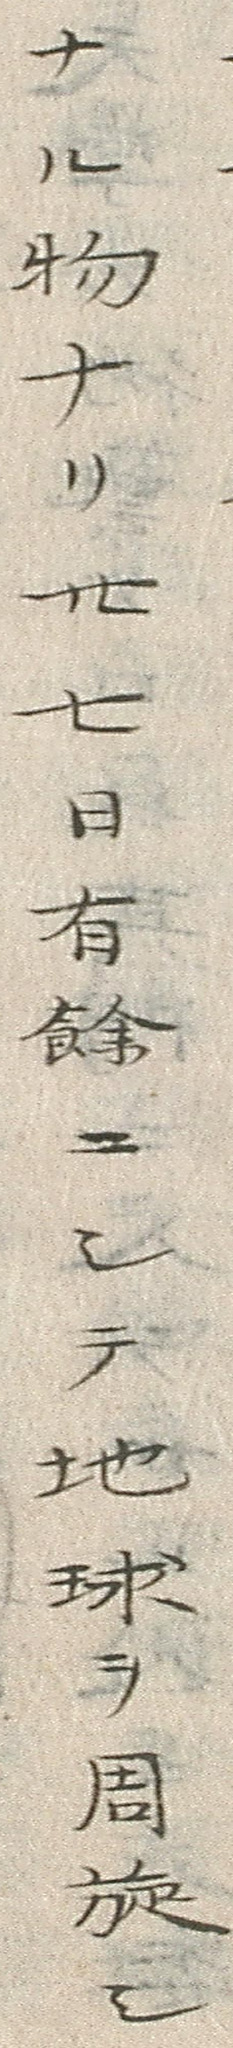ナル物ナリ廿七日有余ニシテ地球ヲ周旋シ
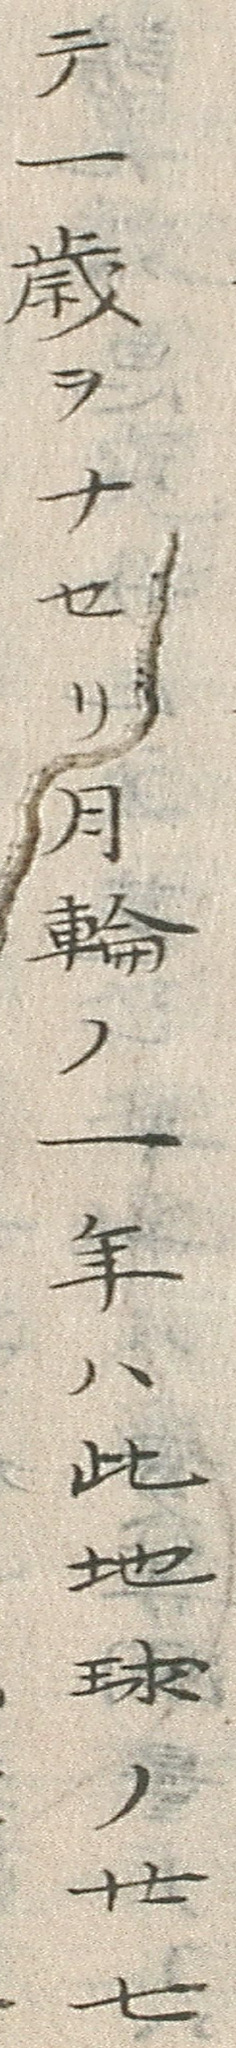テ一歳ヲナセリ月輪ノ一年ハ此地球ノ廿七
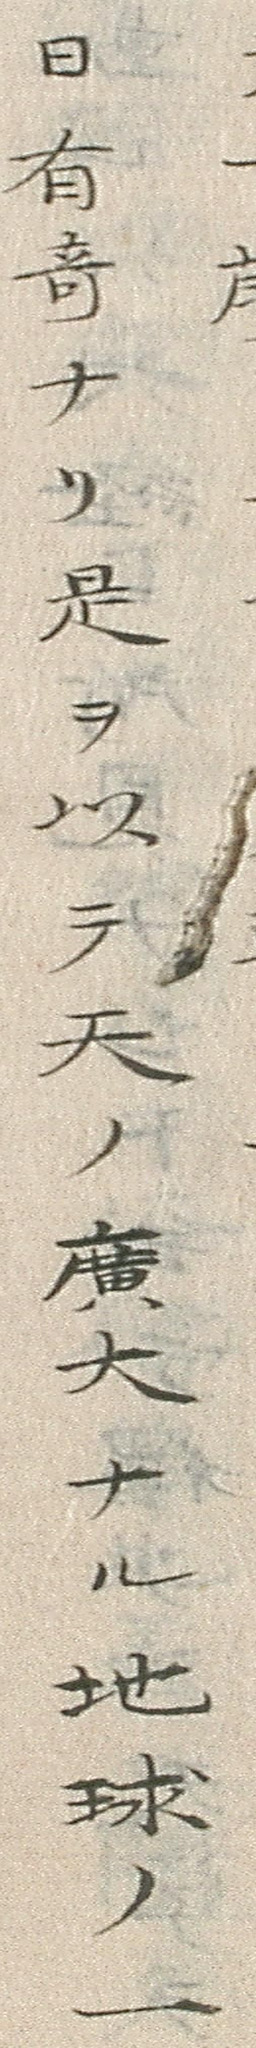日有奇ナリ是ヲ以テ天ノ広大ナル地球ノ一
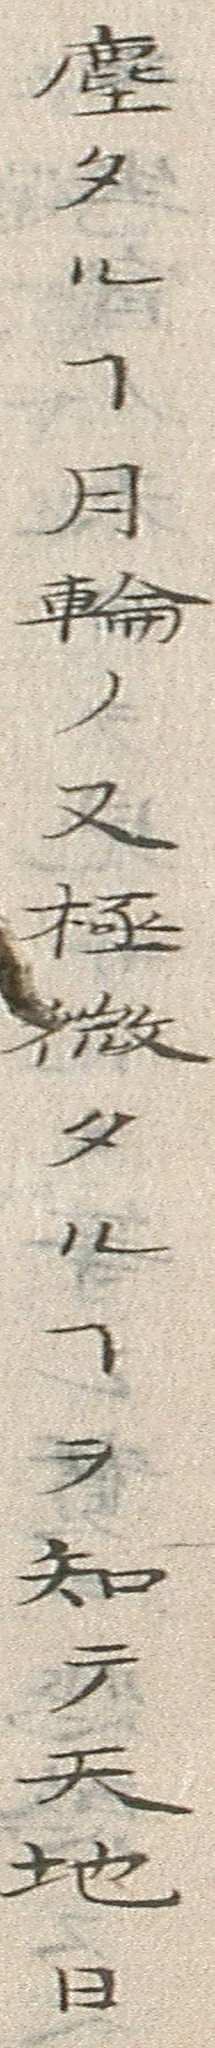塵タルコト月輪ノ又極微タルコトヲ知テ天地日
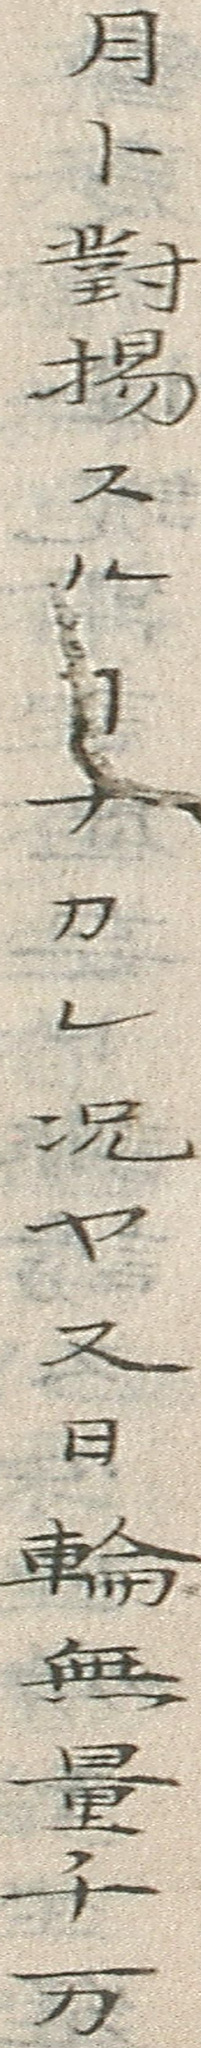月ト対揚スルコトナカレ況ヤ又日輪無量千万
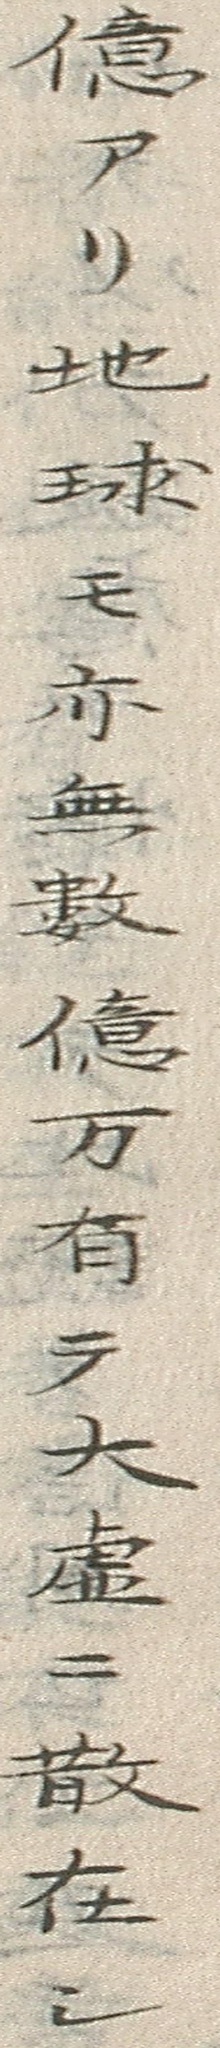億アリ地球モ亦無数億万有テ大虚ニ散在シ
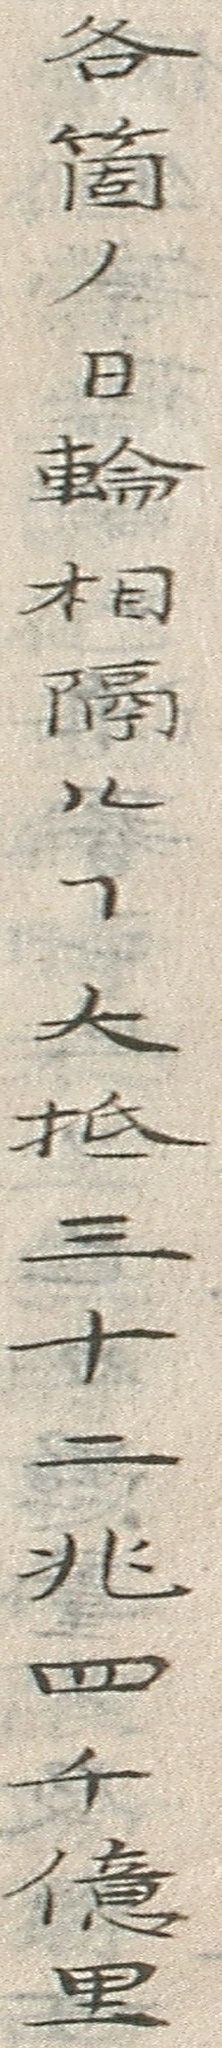各箇ノ日輪相隔ルコト大抵三十二兆四千億里
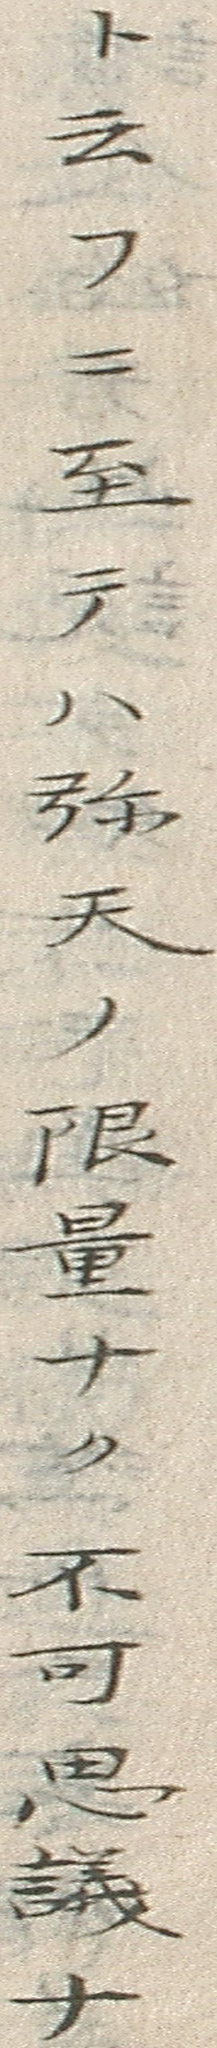ト云フニ至テハ弥天ノ限量ナク不可思議ナ
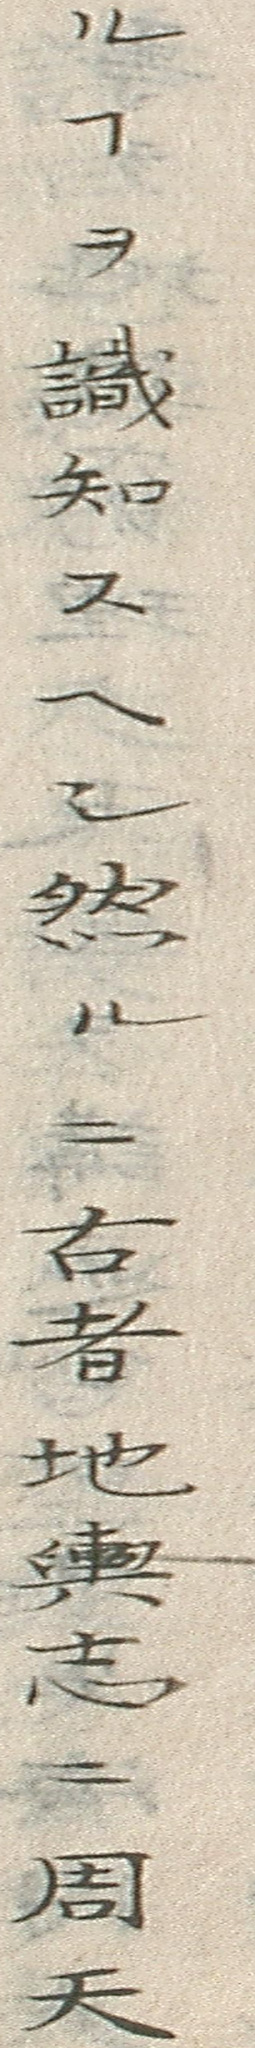ルコトヲ識知スヘシ然ルニ古者地輿志ニ周天
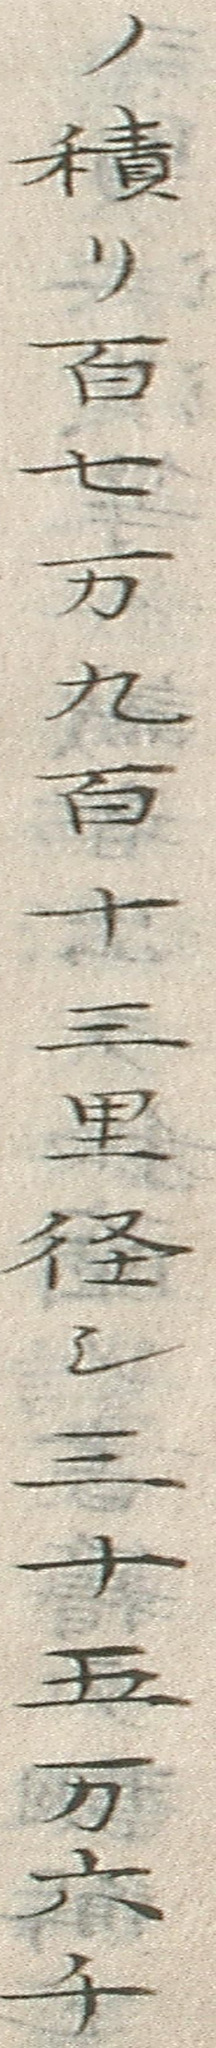ノ積リ百七万九百十三里径シ三十五万六千
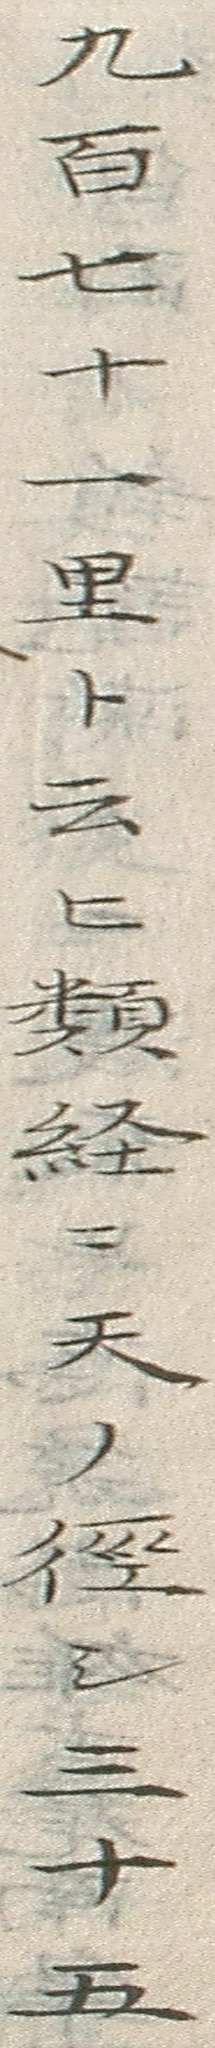九百七十一里ト云ヒ類経ニ天ノ径シ三十五
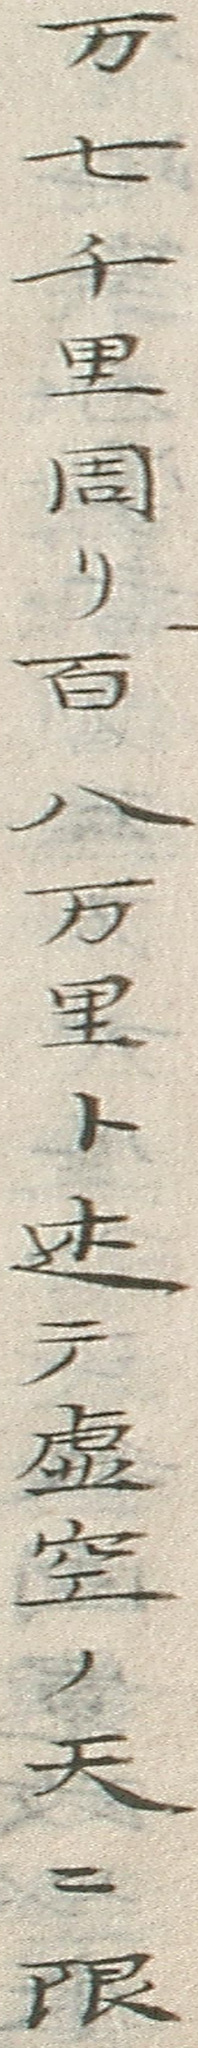万七千里周リ百八万里ト述テ虚空ノ天ニ限
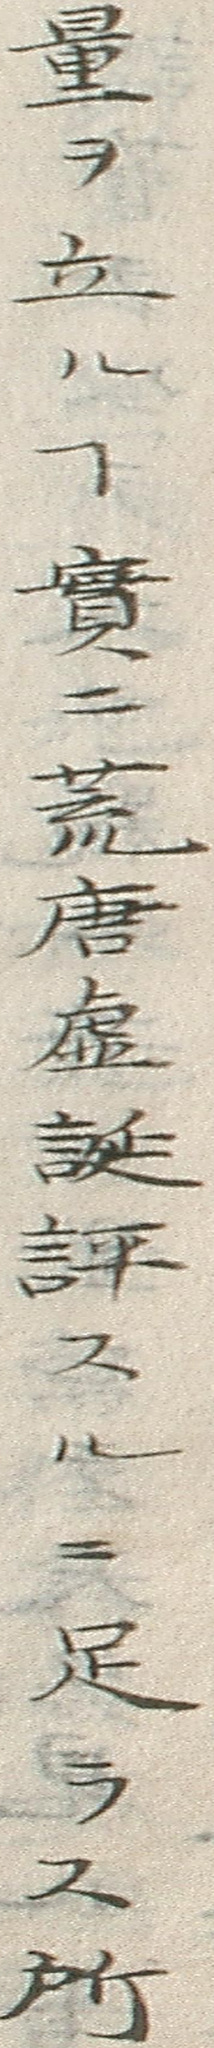量ヲ立ルコト実ニ荒唐虚誕評スルニ足ラス所

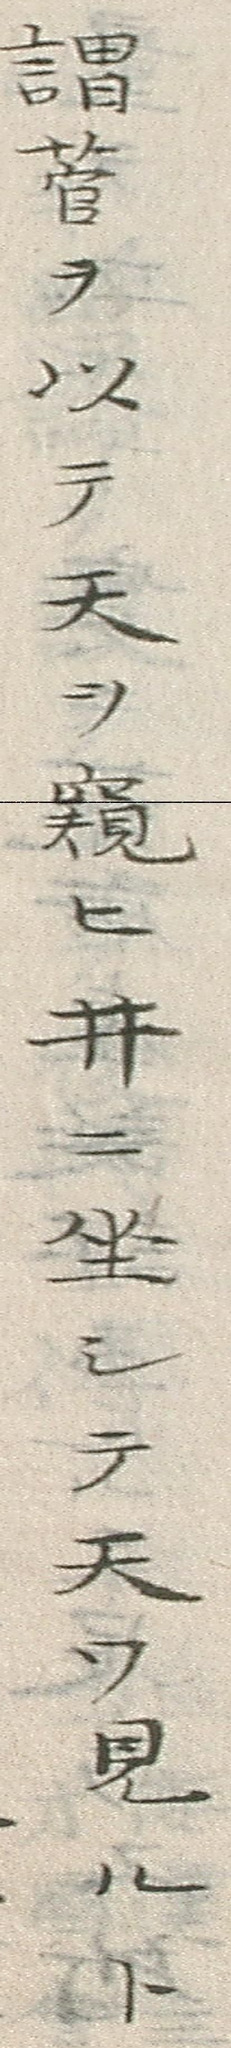謂菅ヲ以テ天ヲ窺ヒ井ニ坐シテ天ワ見ルト
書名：天學略名目羽翼　全
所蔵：東京大学地震研究所図書室 Earthquake Research Institute Library, The University of Tokyo, JAPAN
